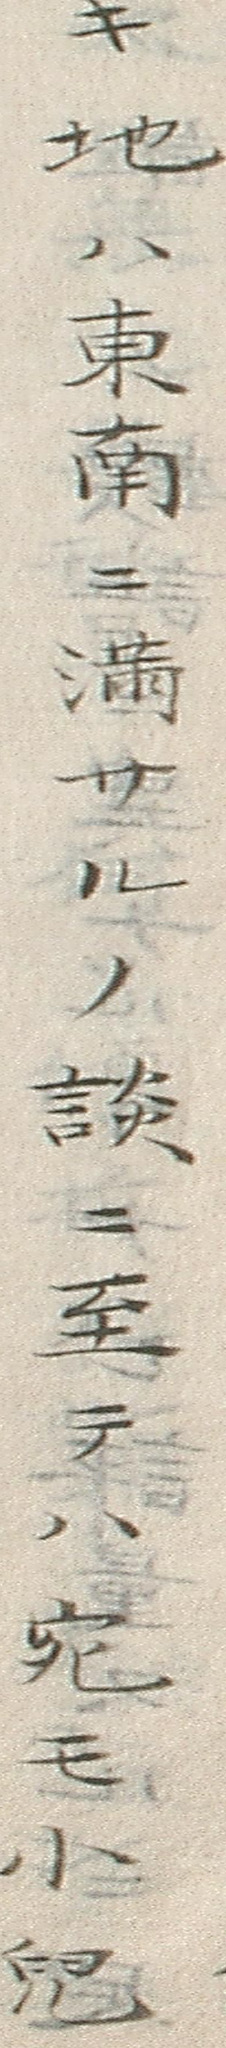キ地ハ東南ニ満サルノ談ニ至テハ宛モ小児

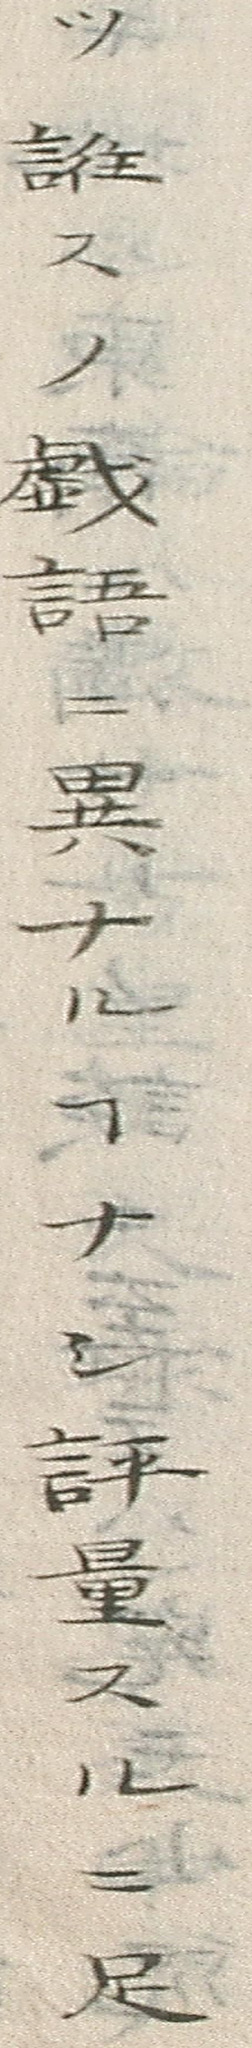ツ誑スノ戯語ニ異ナルコトナシ評量スルニ足
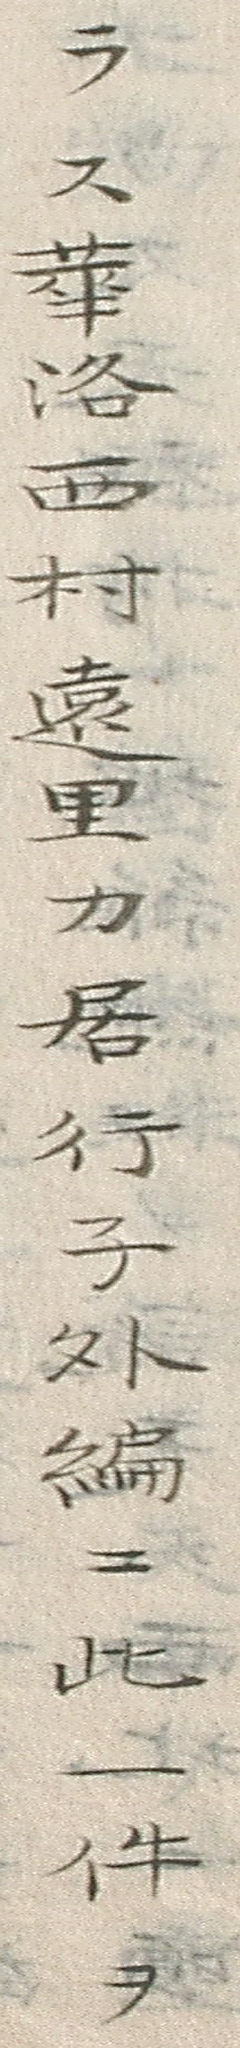ラス華洛西村遠里カ居行子外編ニ此一件ヲ
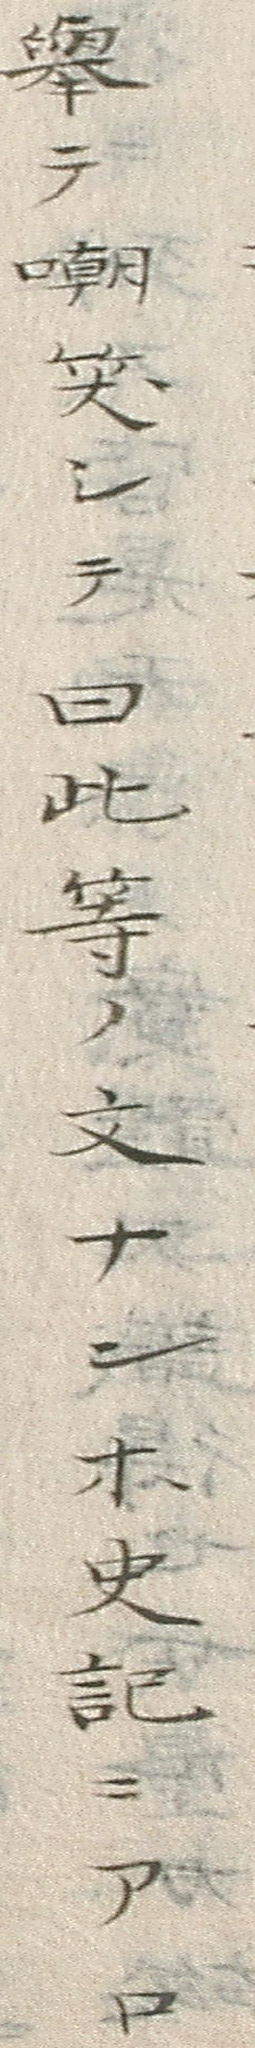挙テ嘲笑シテ曰此等ノ文ナン等史記ニアロ
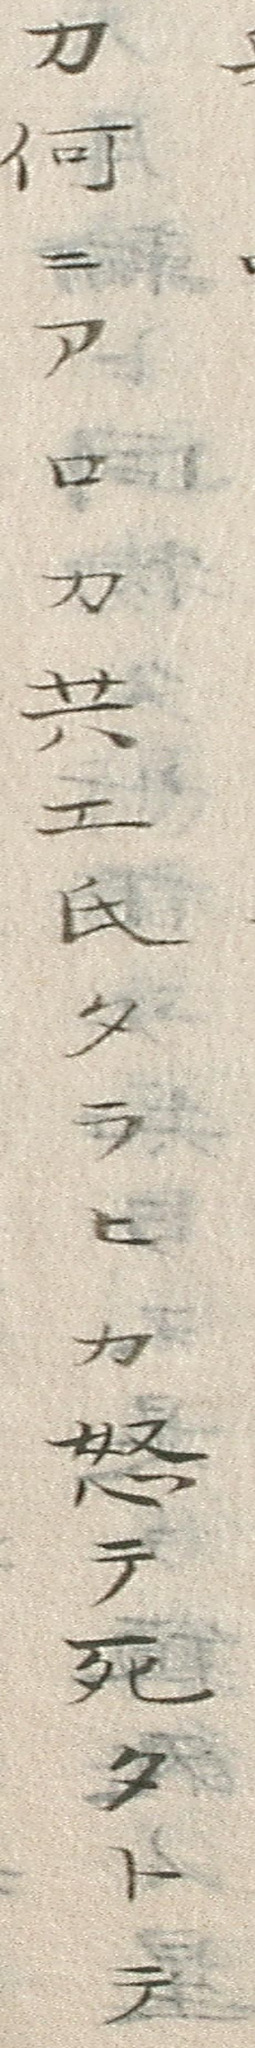カ何ニアロカ共エ氏タラヒカ怒テ死タトテ
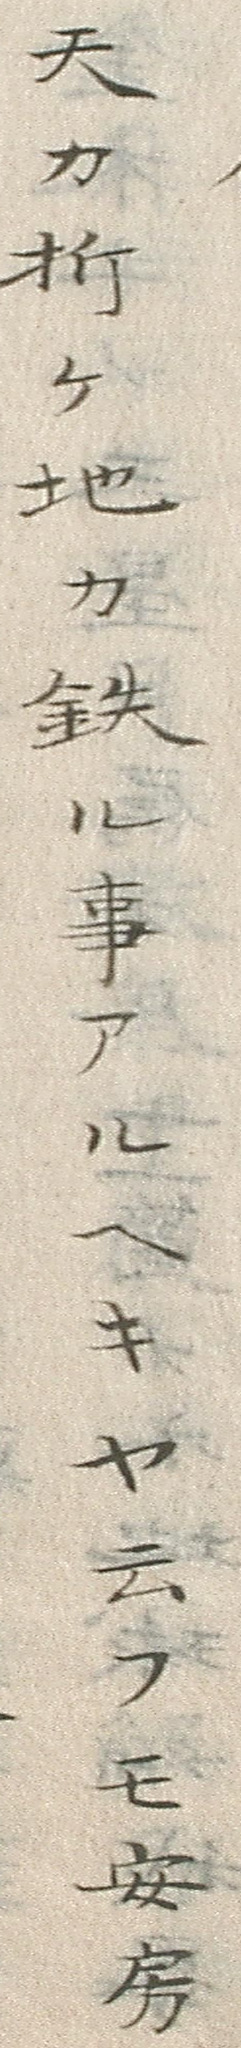天カ折ケ地カ鉄ル事アルヘキヤ云フモ安房
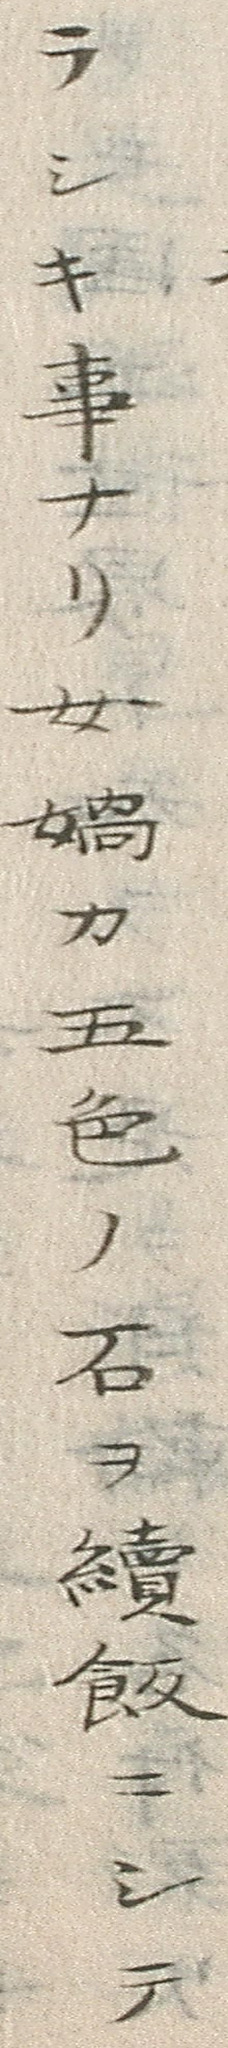ラシキ事ナリ女媧カ五色ノ石ヲ続飯ニシテ
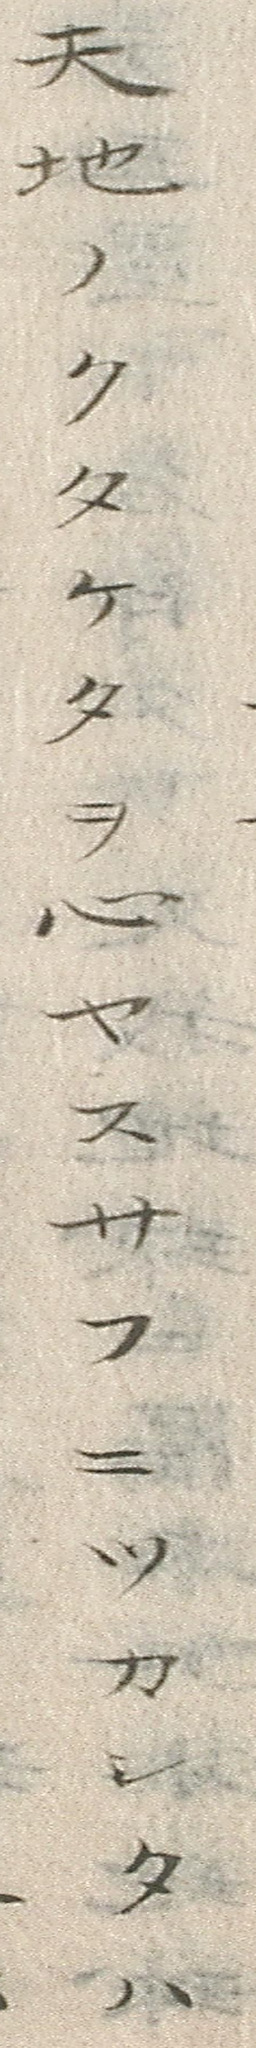天地ノクタケタヲ心ヤスサフニツカシタハ
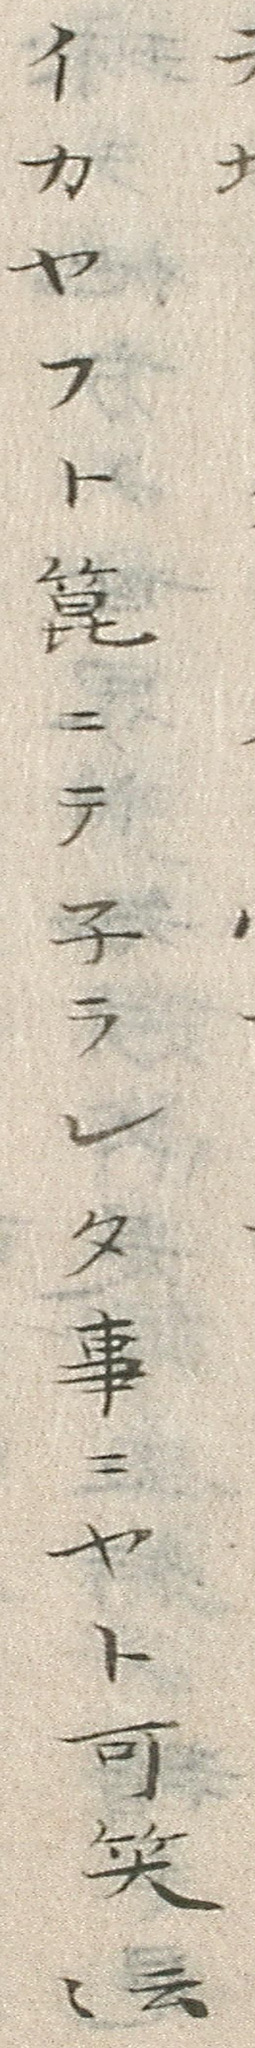イカヤフト箟ニテネラレタ事ニヤト可笑云〻
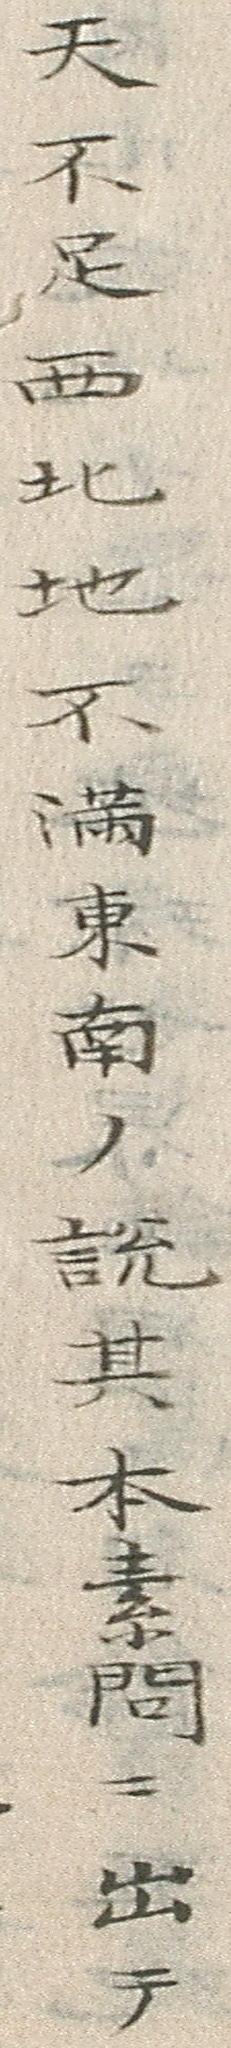天不足西北地不満東南ノ説其本素問ニ出テ
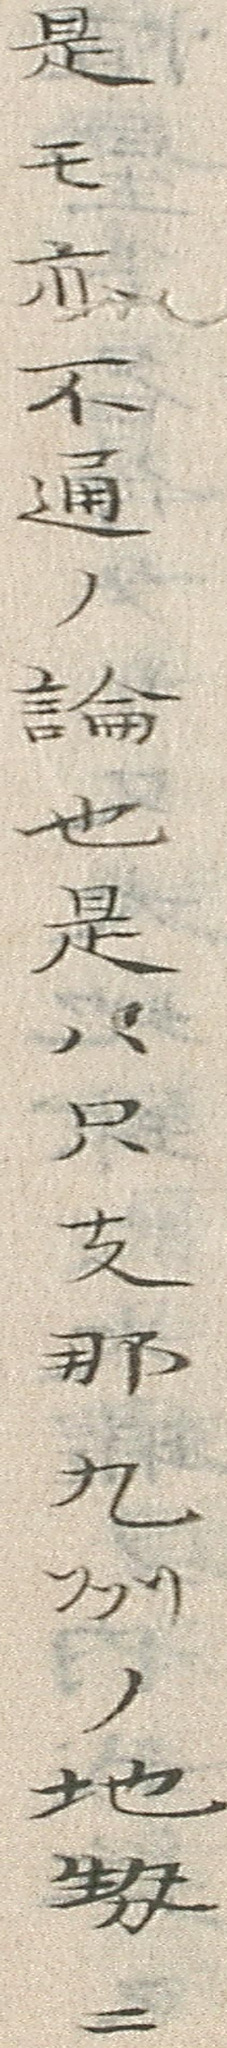是モ亦不通ノ論也是ハ只支那九州ノ地勢ニ
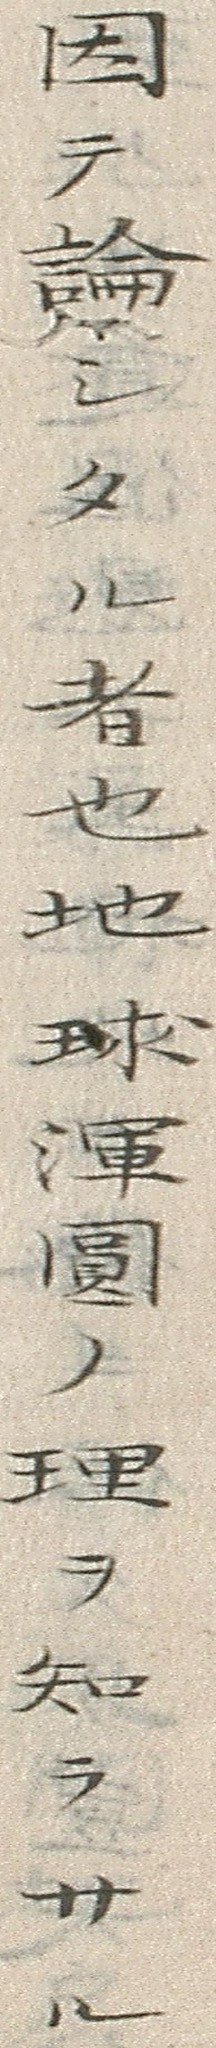因テ論シタル者也地球渾円ノ理ヲ知ラサル
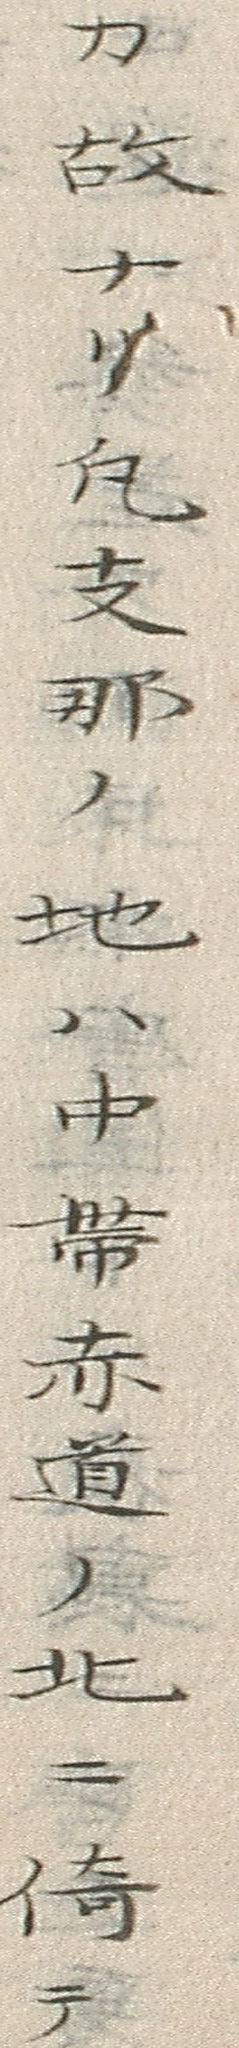カ故ナリ凡支那ノ地ハ中帯赤道ノ北ニ倚テ
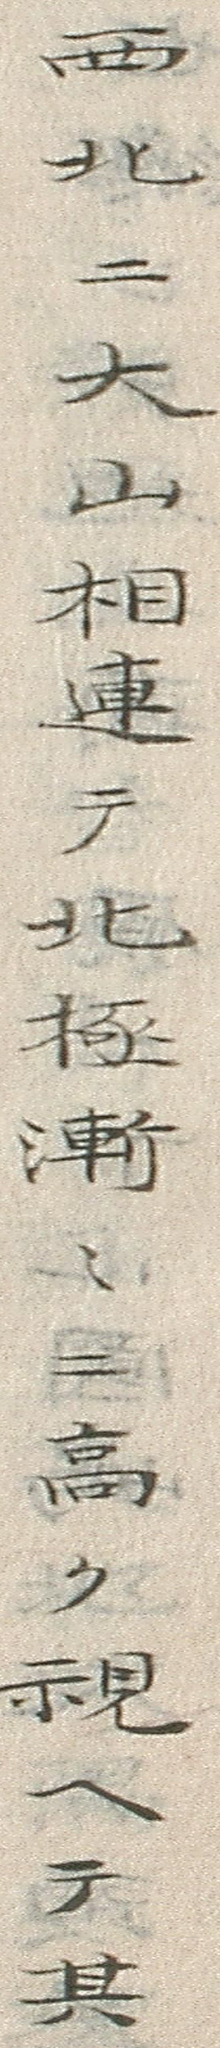西北ニ大山相連テ北極漸〻ニ高ク視ヘテ其
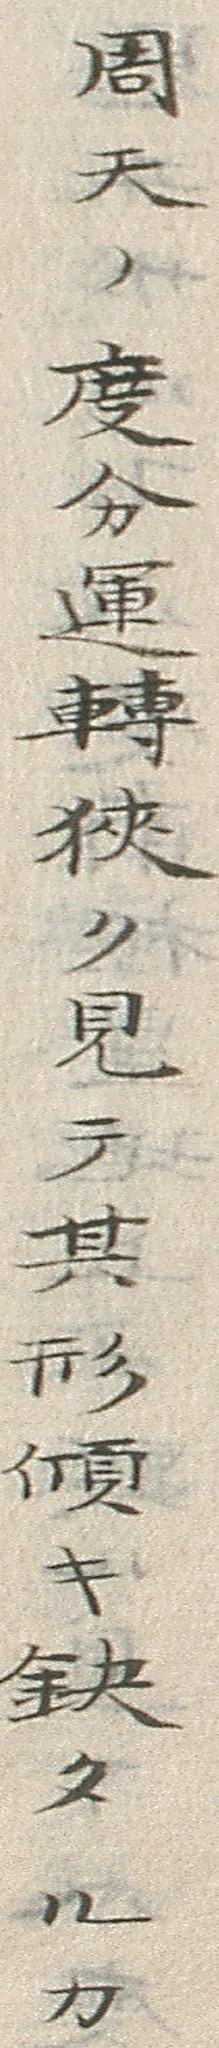周天ノ度分運転狭ク見テ其形傾キ鈌タルカ
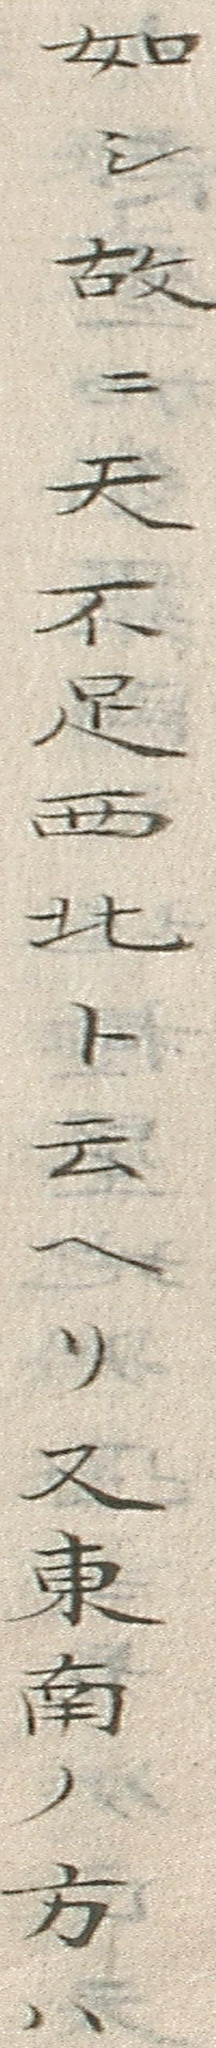如シ故ニ天不足西北ト云ヘリ又東南ノ方ハ
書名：天學略名目羽翼　全
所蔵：東京大学地震研究所図書室 Earthquake Research Institute Library, The University of Tokyo, JAPAN
